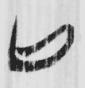㠯（以）
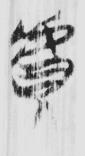{虍貝}
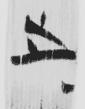之
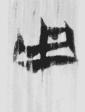用
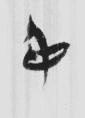身
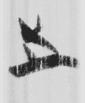之
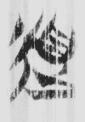道
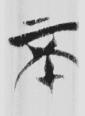不
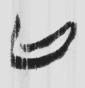㠯（以）
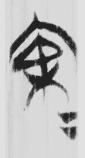冥=
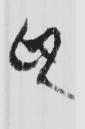卬
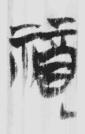福
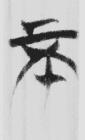不
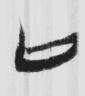㠯（以）
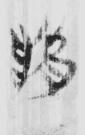{爿兔}
